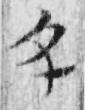丑
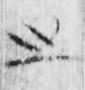之
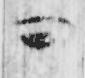日
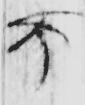不
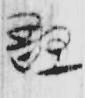○（屬）
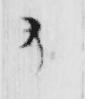人
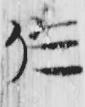於
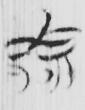○（宗）
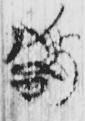豫
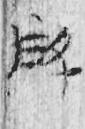阩
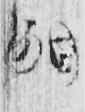門
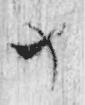又
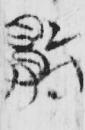敗
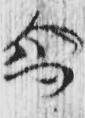宵
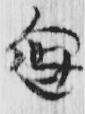被
